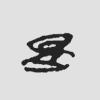是
